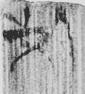死
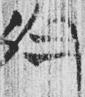於
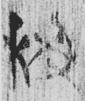梁
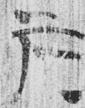下
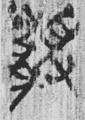○（狻）
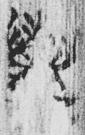貎（猊）
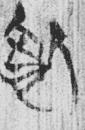○（食）
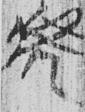虎
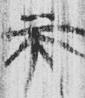天
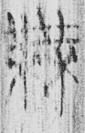無
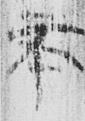不
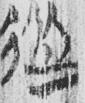從
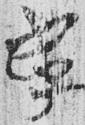好
